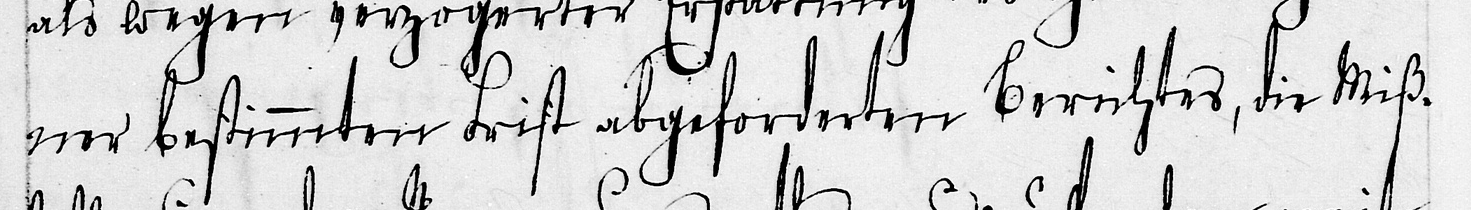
ner bestimmten Frist abgeforderten Berichtes, die Miß¬
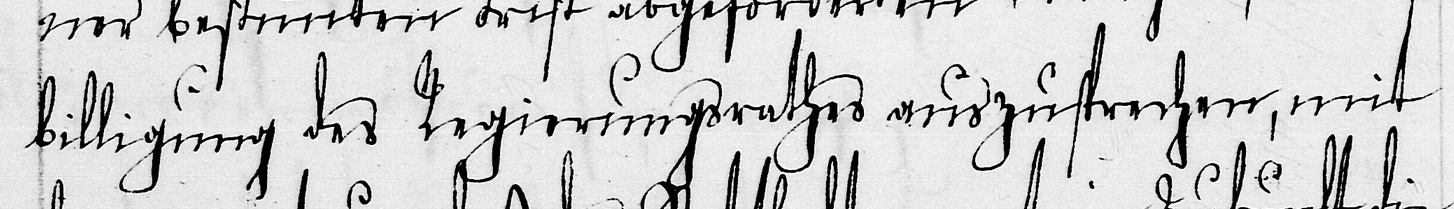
billigung des Regierungsrathes auszusprechen, mit
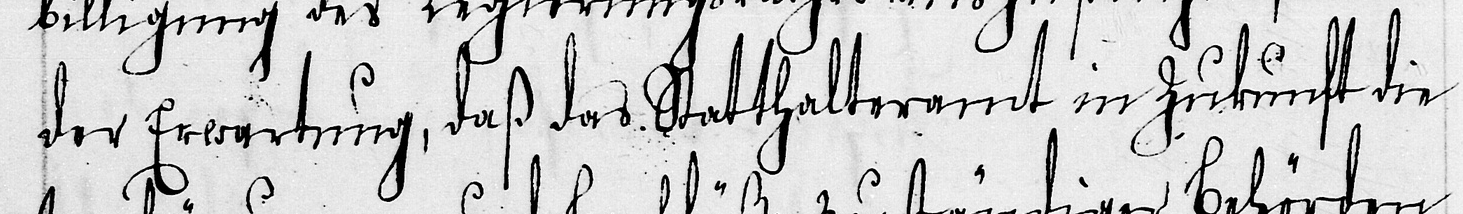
der Erwartung, daß das Statthalteramt in Zukunft die
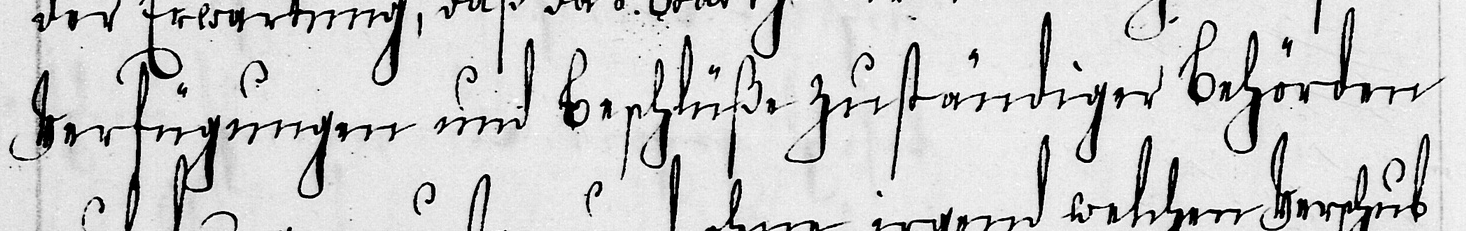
Verfügungen und Beschlüße zuständiger Behörden
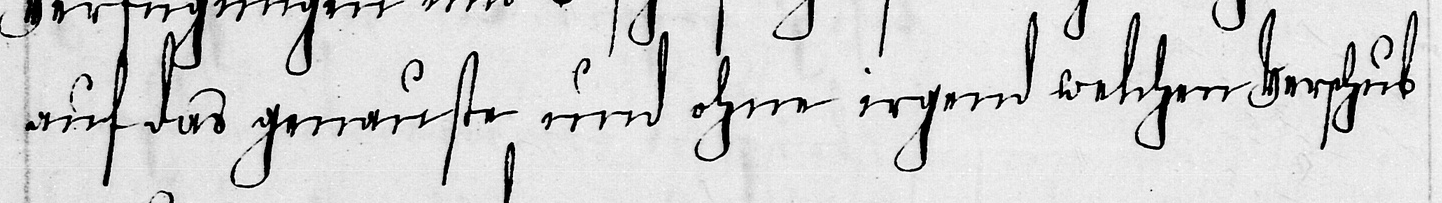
auf das genauste und ohne irgend welchen Verschub
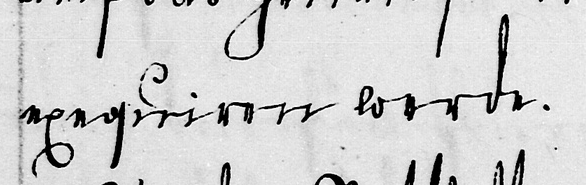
exequiren werde.
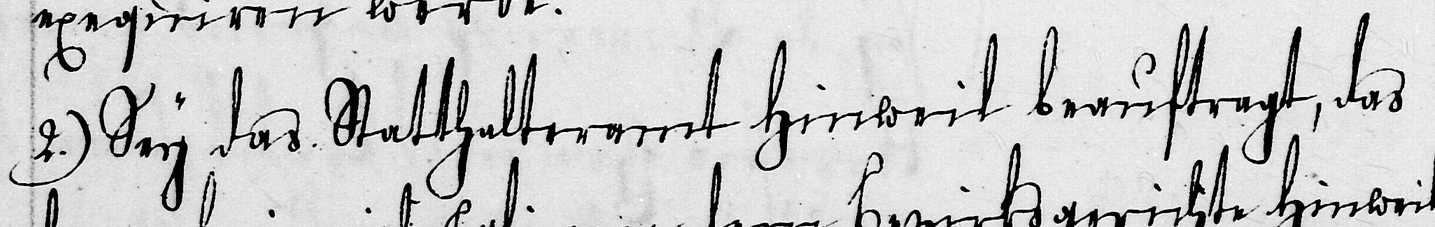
2.) Sey das Statthalteramt Hinweil beauftragt, das
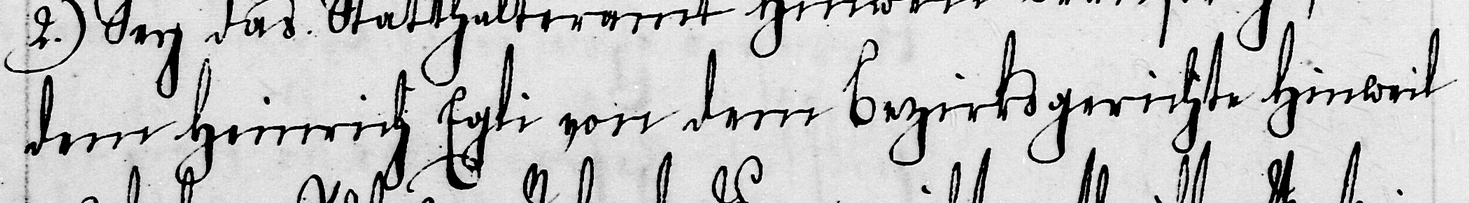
dem Heinrich Egli von dem Bezirksgerichte Hinweil
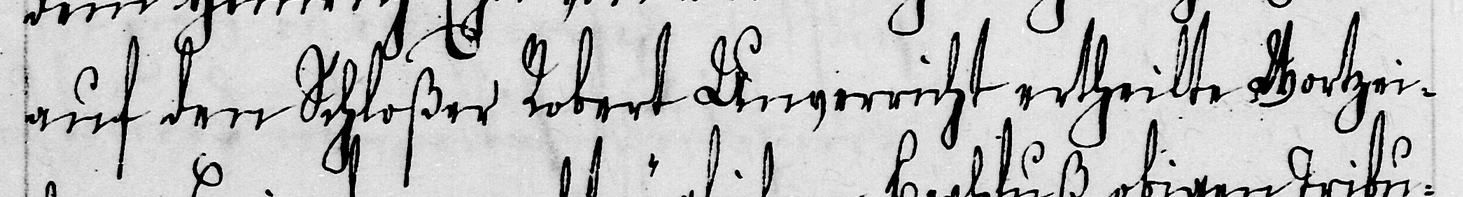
auf den Schloßer Robert Unverricht ertheilte Wortzei¬
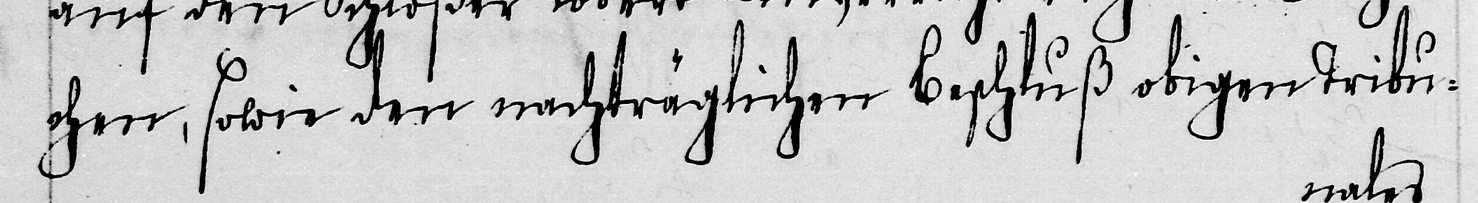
chen, sowie den nachträglichen Beschluß obigen Tribu-
